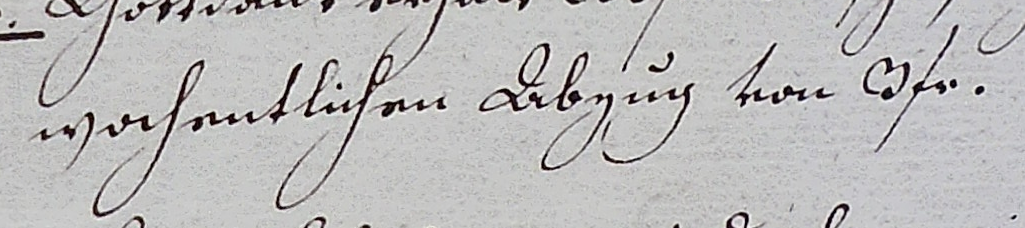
wochentlichen Abzug von 8fr.
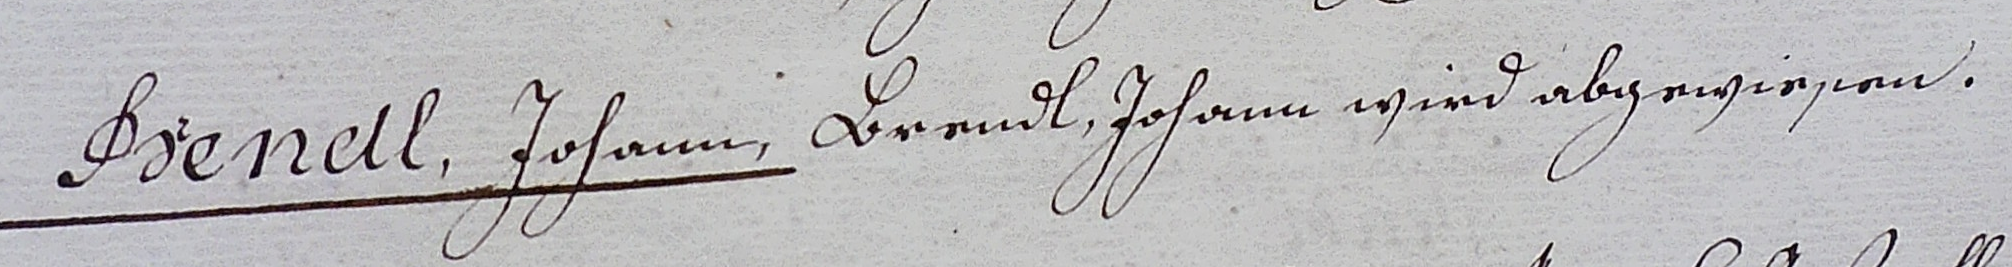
Brendl, Johann, Brendl, Johann wird abgewiesen.
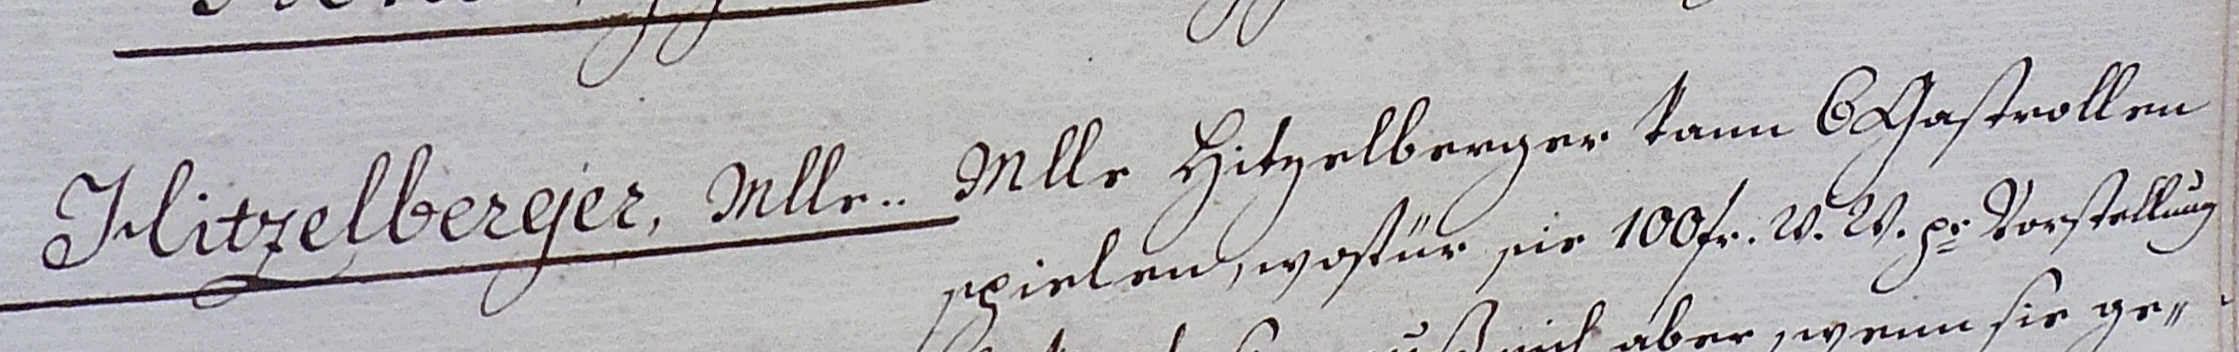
Hitzelberger, Mlle.. Mlle Hitzelberger kann 6 Gastrollen
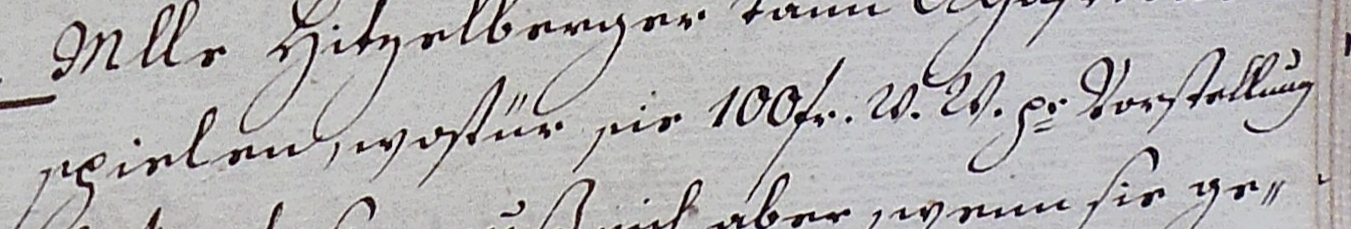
spielen, wofür sie 100fr. W.W. pr͇ Vorstellung
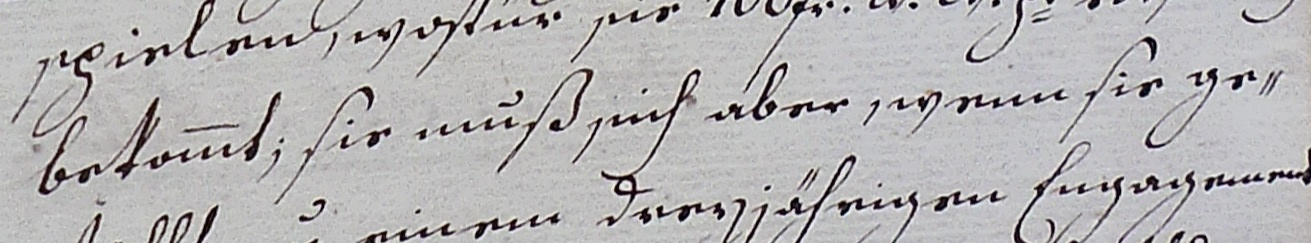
bekom̅t; sie muß sich aber, wenn sie ge¬
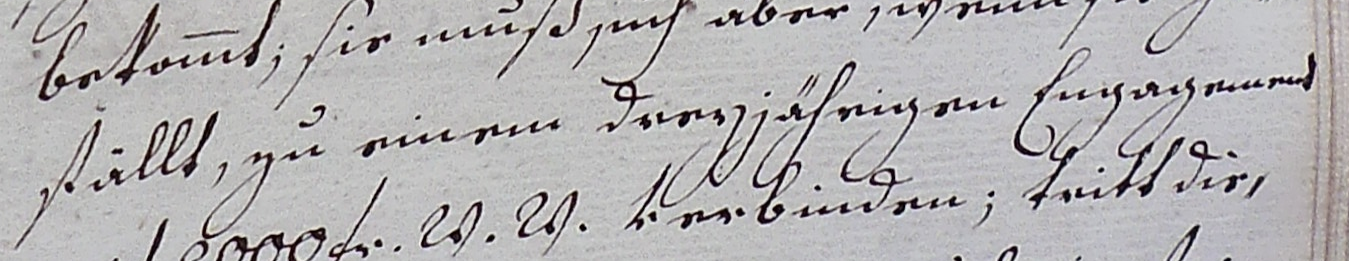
fällt, zu einem dreyjährigen Engagement
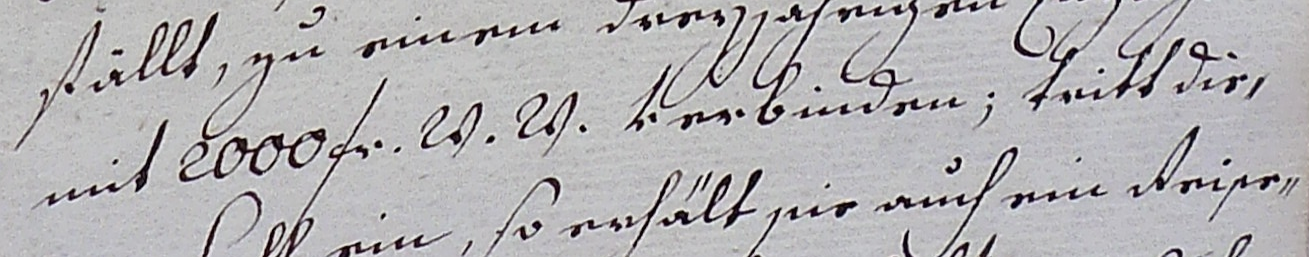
mit 2000fr. W.W. verbinden; tritt die¬
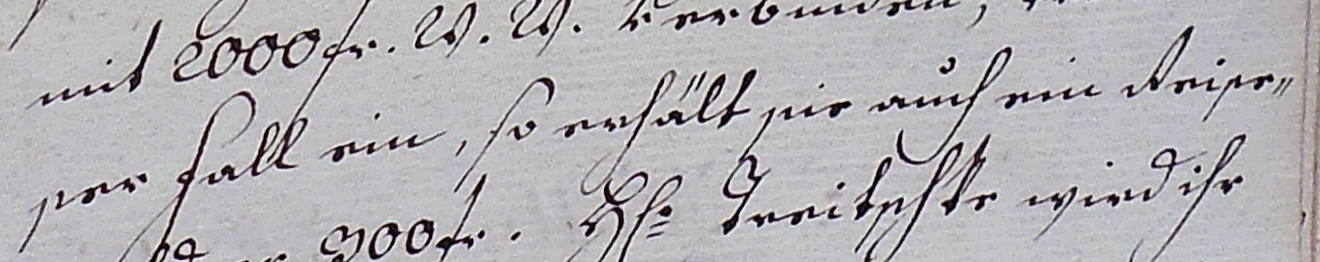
ser Fall ein, so erhält sie auch ein Reise¬
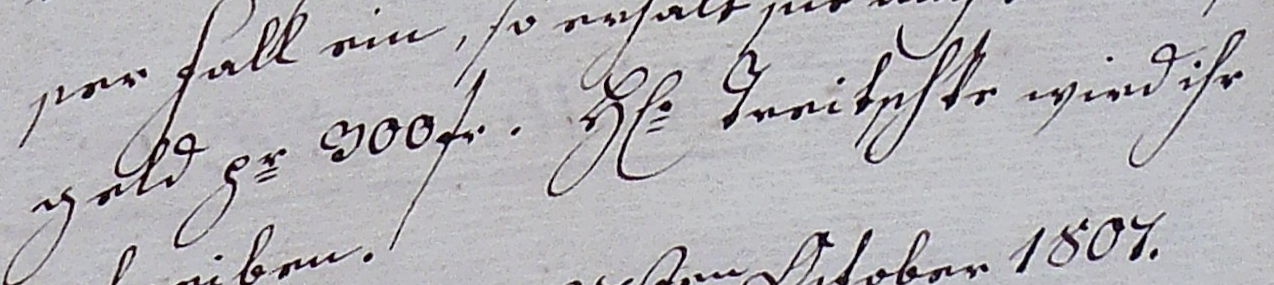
geld pr͇ 300fr. HEr͇ Treitschke wird ihr
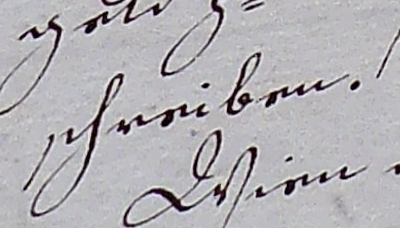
schreiben.
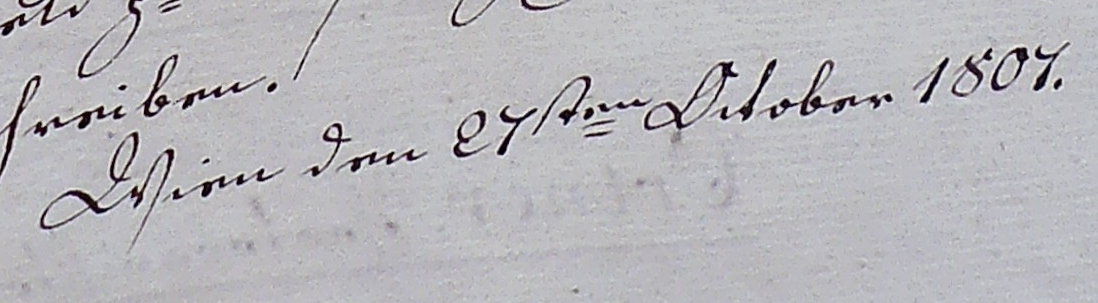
Wien den 27ste͇n October 1807.
